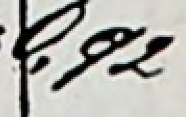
0,92
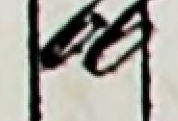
66
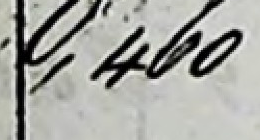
0,460
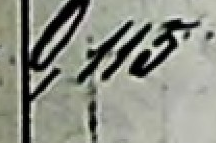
0,115
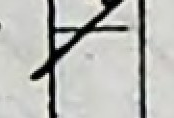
7
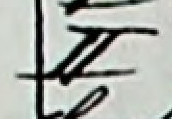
II
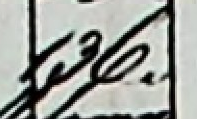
136
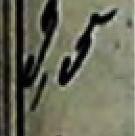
3,5
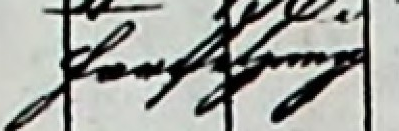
Forstetzung
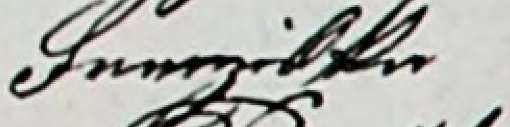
Franziska
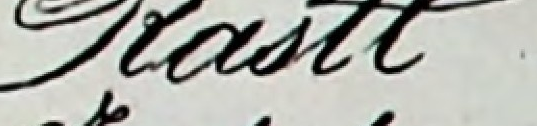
Rastl
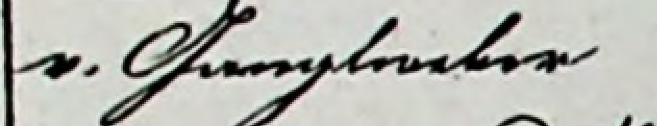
v. Gangtroeber
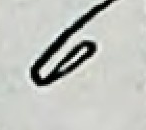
6
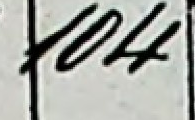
104
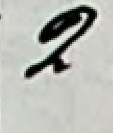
2
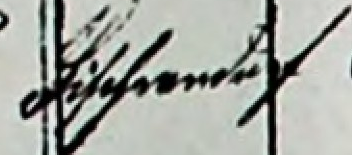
Fischerndorf
